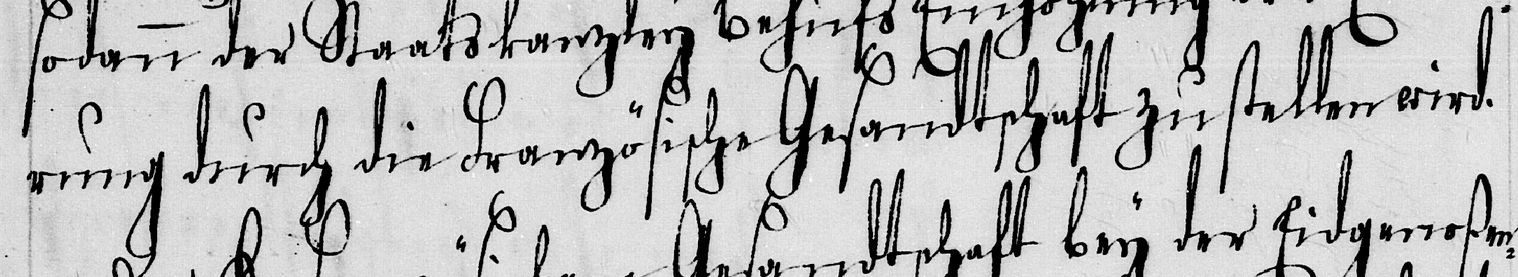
erung durch die Französische Gesandtschaft zustellen
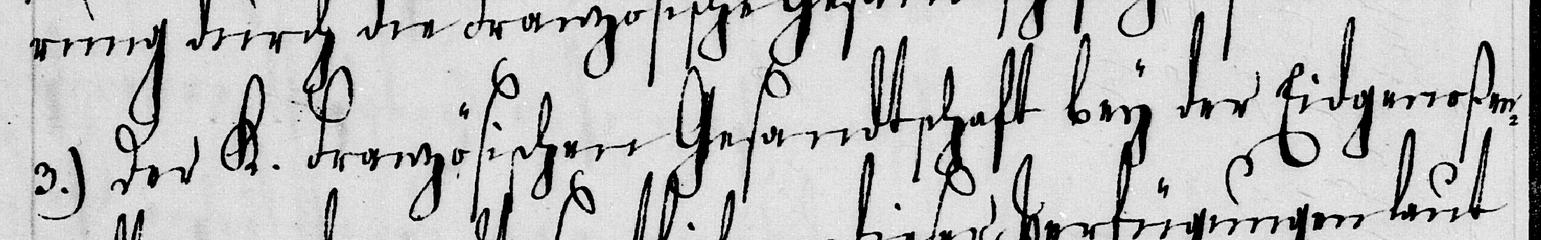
3.) Der K. Französischen Gesandtschaft bey der Eidgenoß¬
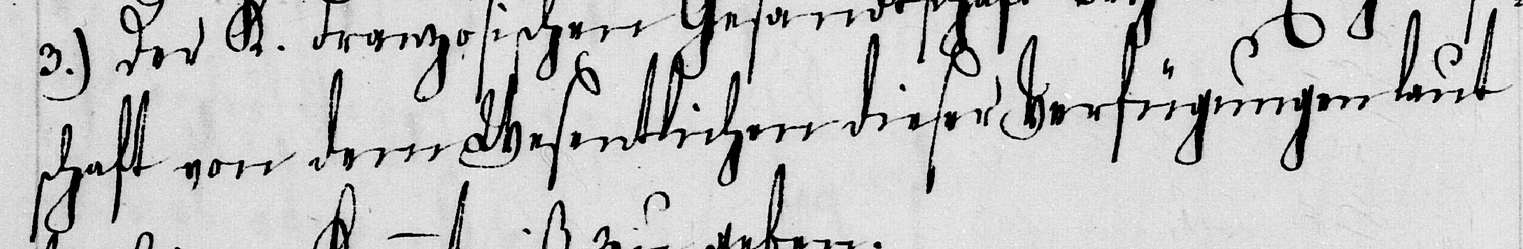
schaft von dem Wesentlichen dieser Verfügungen laut
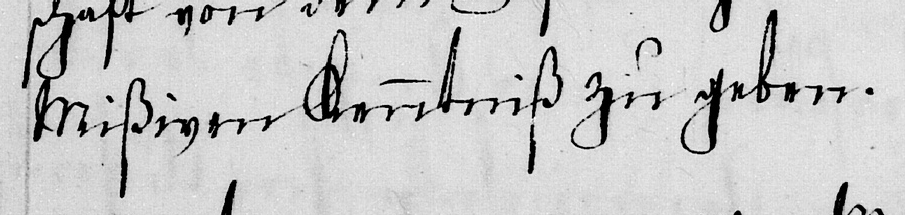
Mißiven Kenntniß zu geben.
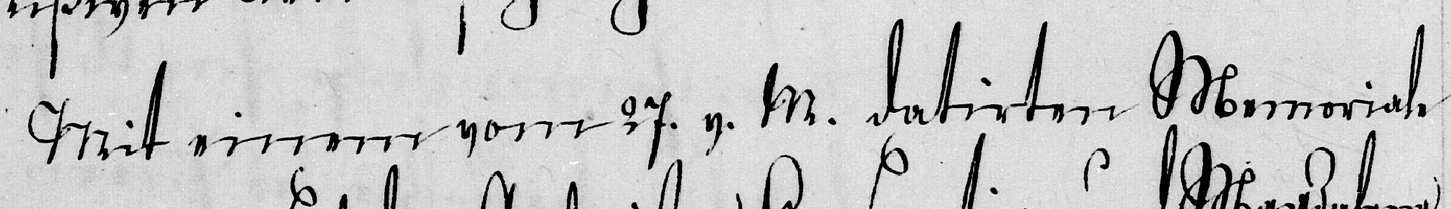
Mit einem vom 27. v. M. datirten Memoriale
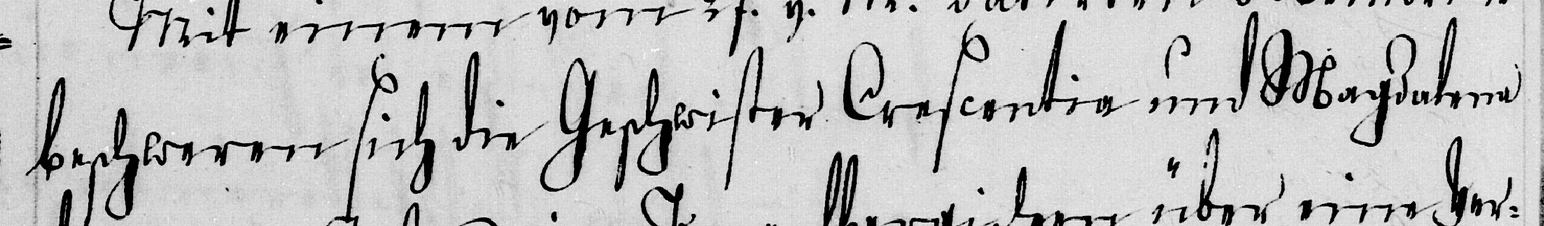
beschweren sich die Geschwister Crescentia und Magdalena
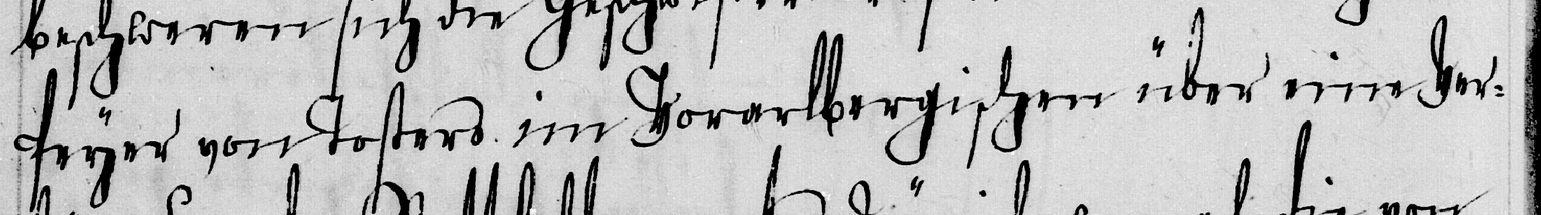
Peyer von Tosters im Vorarlbergischen über eine Ver¬
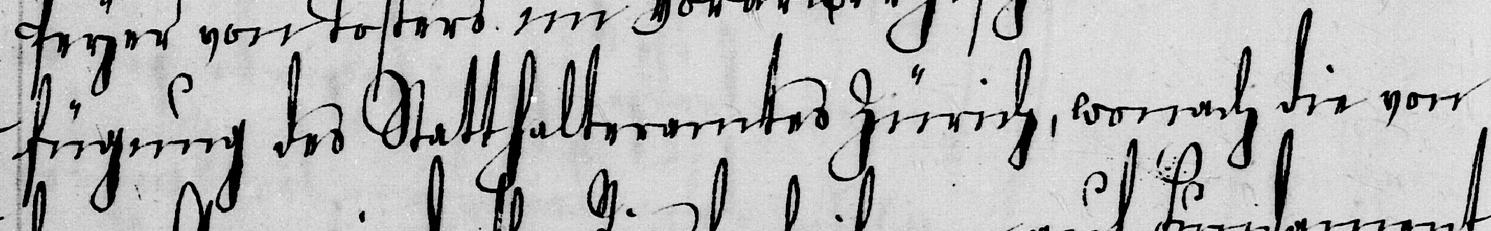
fügung des Statthalteramtes Zürich, wonach die von
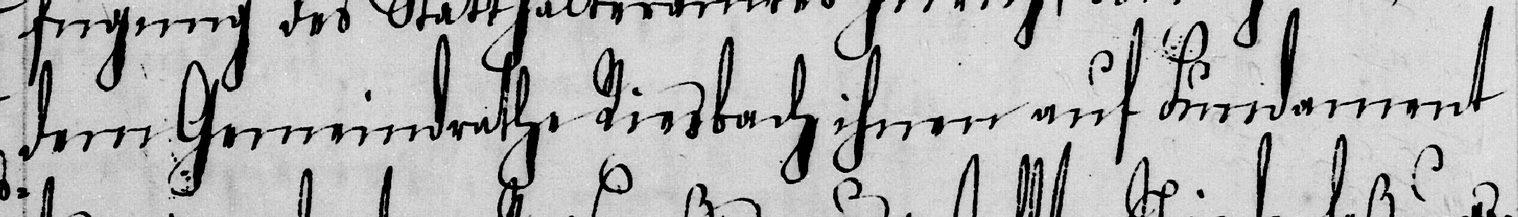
dem Gemeindrathe Riesbach ihnen auf Fundament
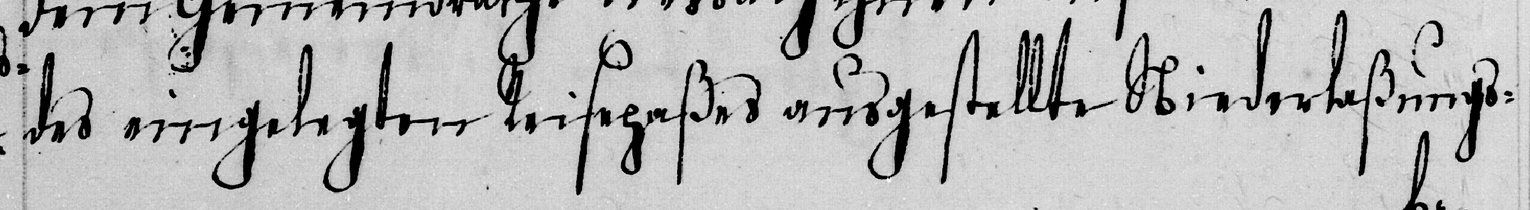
des eingelegten Reisepaßes ausgestellte Niederlaßungs-
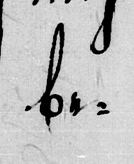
en¬
